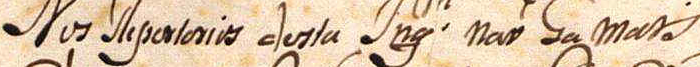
Nos Reportorios desta Inq.m naõ ha mais
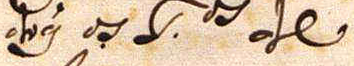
do q̄ os T.os de
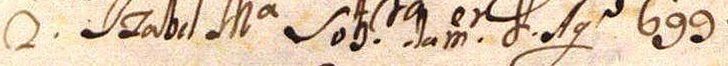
2. Izabel Ma sob̄.ra da mer. 8. Ago 699.
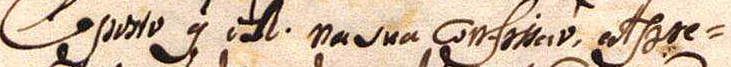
E posto q̄ o R. na sua Confissaõ, e Apre
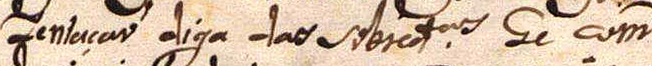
zentaçaõ diga das sobred̄.as he com
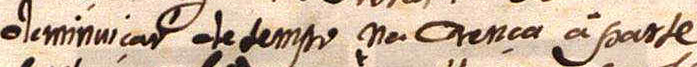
deminuiçaõ de tempo na Crença á parte
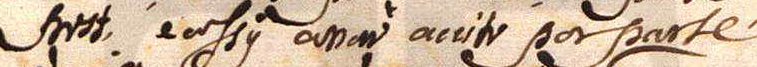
post, e assy a naõ aceito por parte
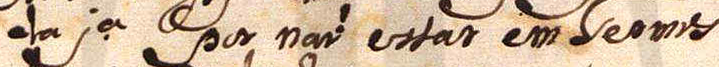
da j.a por naõ estar em Termos
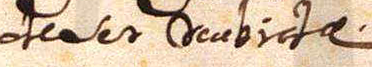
de ser recebida.
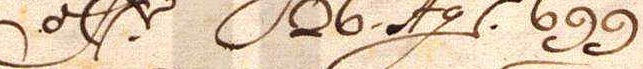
off.o 26. Ag.o 699.
